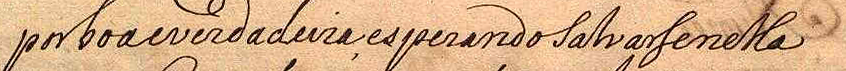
por boa e verdadeira, esperando Salvarse nella
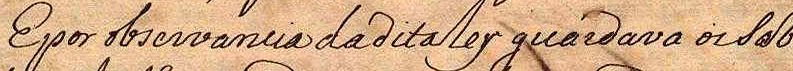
E por observancia da dita Ley guardava os Sab
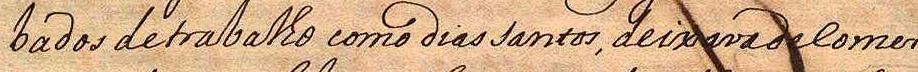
bados de trabalho como dias santos, deixava de Comer
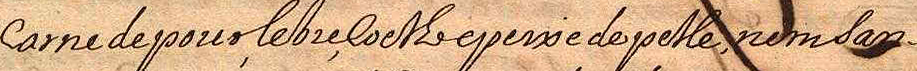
Carne de porco, lebre, Coelho e peixe de pelle, nem San
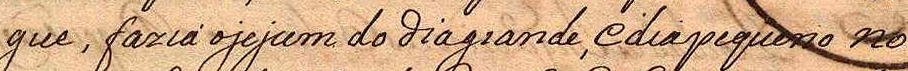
gue, fazia o jejum do dia grande, e dia pequeno no
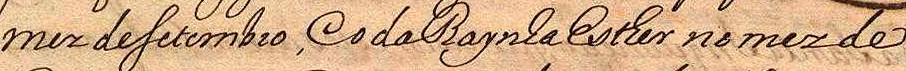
mez de setembro, E o da Raynha Esther no mez de
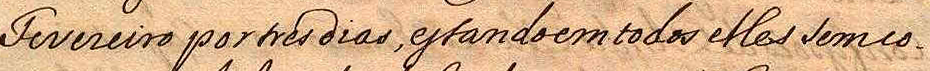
Fevereiro por tres dias, estando em todos elles sem co
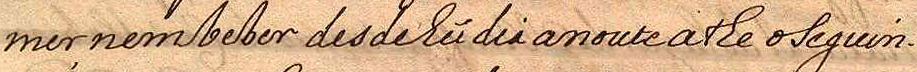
mer, nem beber desde hú dia a noute athe o seguin
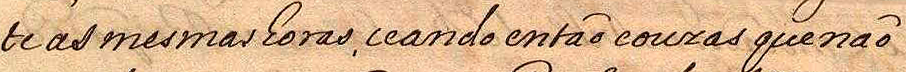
te as mesmas horas, ceando entaõ couzas que naõ
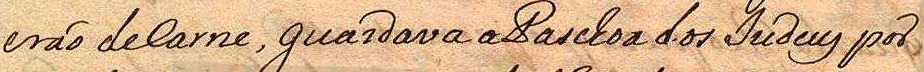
eraõ de Carne, guardava a Paschoa dos Iudeus por
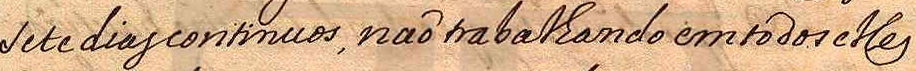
sete dias continuos, naõ trabalhando em todos elles
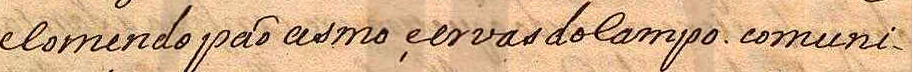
e Comendo paõ asmo, e ervas do Campo comuni
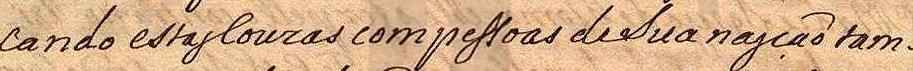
cando estas Couzas com pessoas de Sua nasção tam
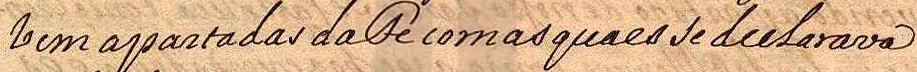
bem apartadas da Fe com as quaes se declarava
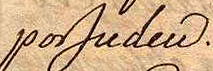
por Judeu.
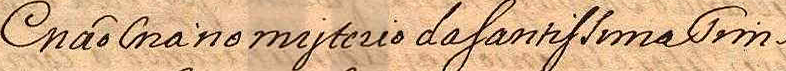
E naõ Cria no misterio da santissima Trin
